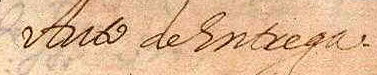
Auto de Entrega.
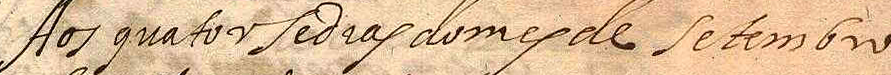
Aos quatorse dias do mes de setembro
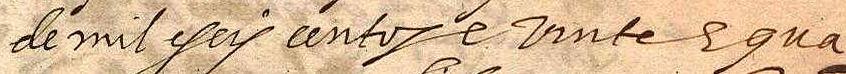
de mil e seiscentos e vinte E qua
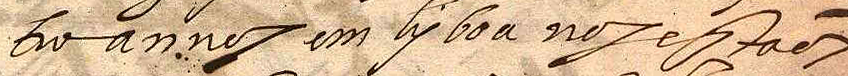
tro annos em lisboa nos estaōs
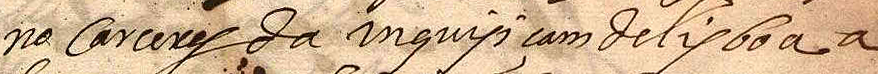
no carceres da inquisiçam de lisboa a
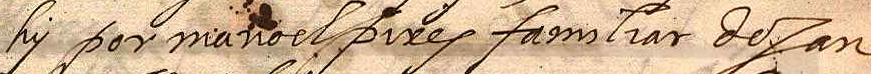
hy por manoel pires familiar do san
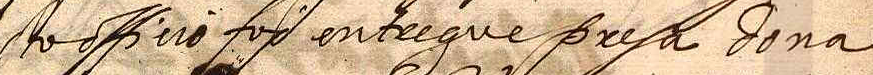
cto officio foi entregue presa dona
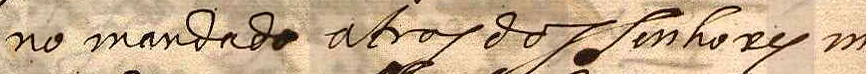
no mandado atras dos senhores in
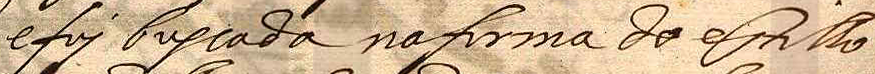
e foj buscada na forma do estillo
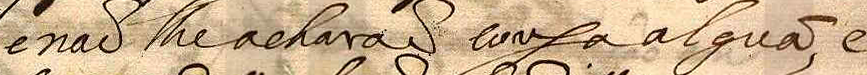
e não lhe acharaõ cousa alguā, e
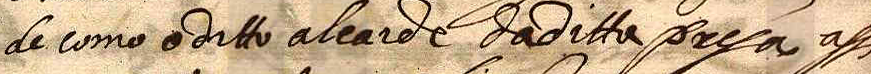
de como o ditto alcaide da ditta presa assi
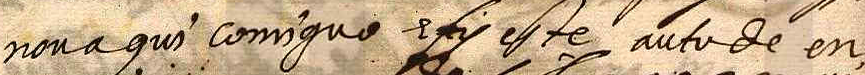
nou aqui comiguo E fis este auto de en
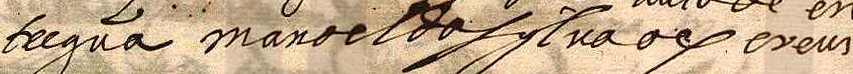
tregua manoel da sylua o escreui
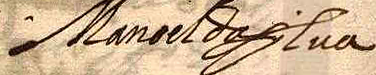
Manoel da silua
